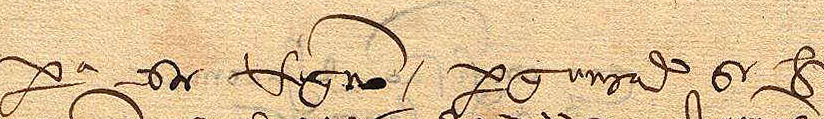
ꝑa este Regno / ꝑguntado se he
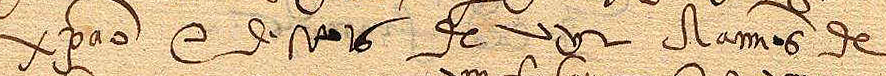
xpão e despois de vyr A ann̄os de
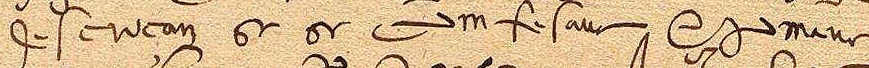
desceiçam se se comfesaua e tomaua
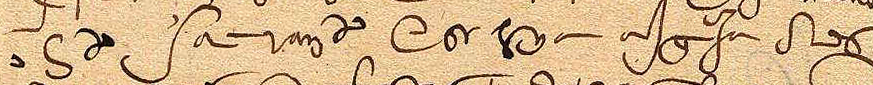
o Sto Sacramto e se hya a JḡJa Aos
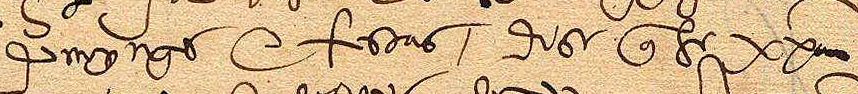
domyngos e festas / dise q̄ he xpā_
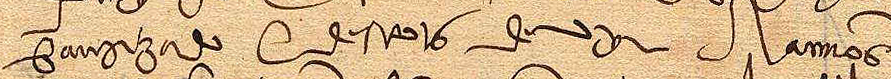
bautizado e despois de vyr A annōs
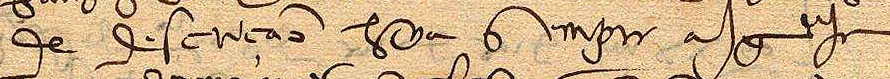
de descriçaõ hya sempre a JḡJa
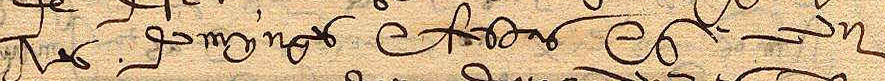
Aos domyngos e festas e se con
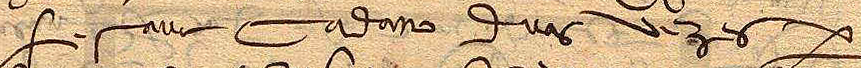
fesaua Cadano duas vezes ꝑ
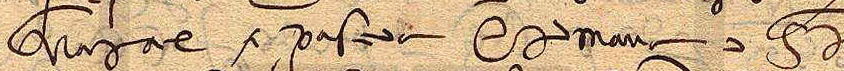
natal e pascoa e tomaua o Sto
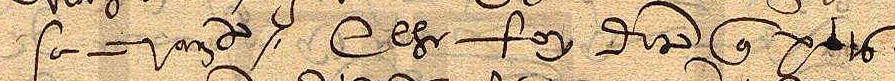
Sacramto /. e lhe foy dit̄o q̅ pois
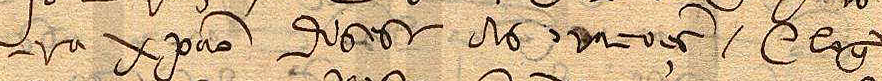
era xpão disese As orações / e logo
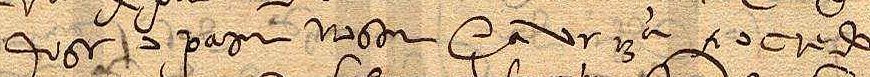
dise o pater noster e ave ma e o credo
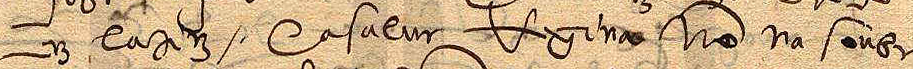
em latim /. e a salue Regina nō na soube
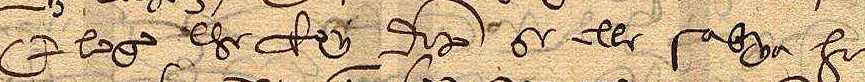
E logo lhe foy dīto se elle sabya ha
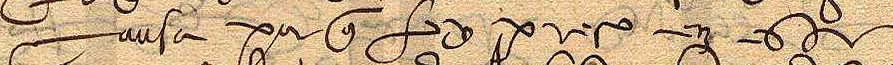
Causa por q̅ foy preso em este
